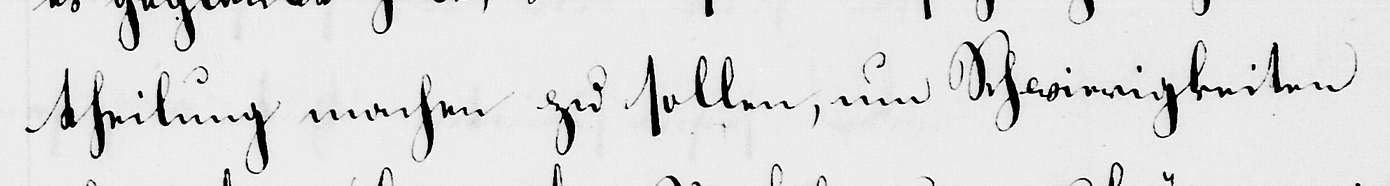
theilung machen zu sollen, und Schwierigkeiten
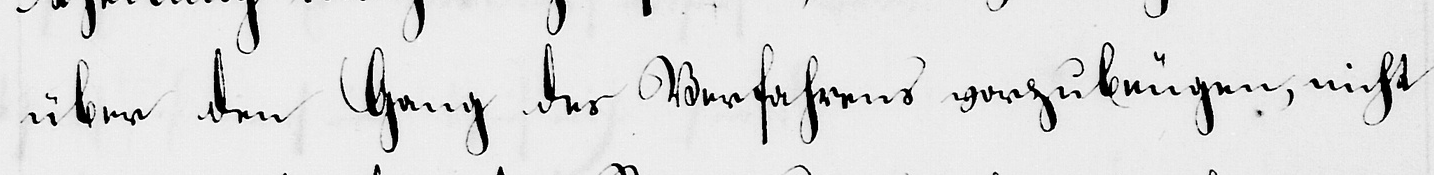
über den Gang des Verfahrens vorzubeugen, nicht
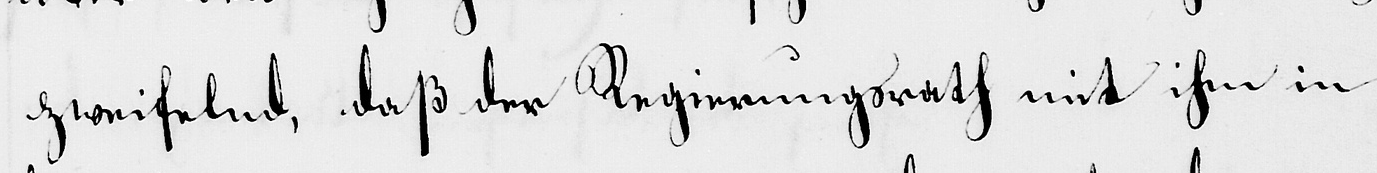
zweifelnd, daß der Regierungsrath mit ihm in
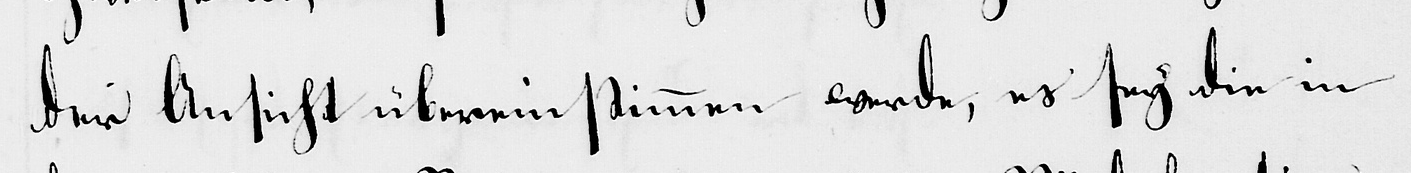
der Ansicht übereinstimmen werde, es sey die in
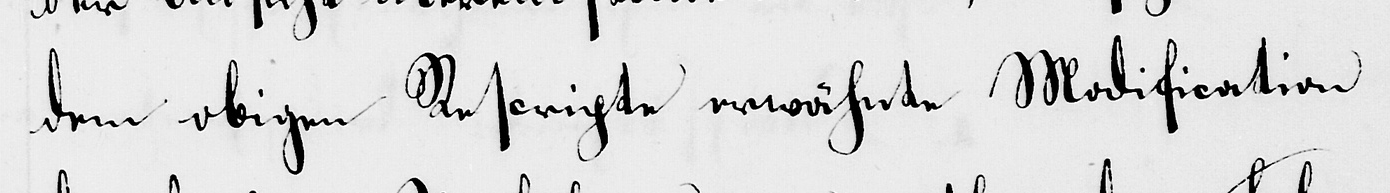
dem obigen Rescripte erwähnte Modification
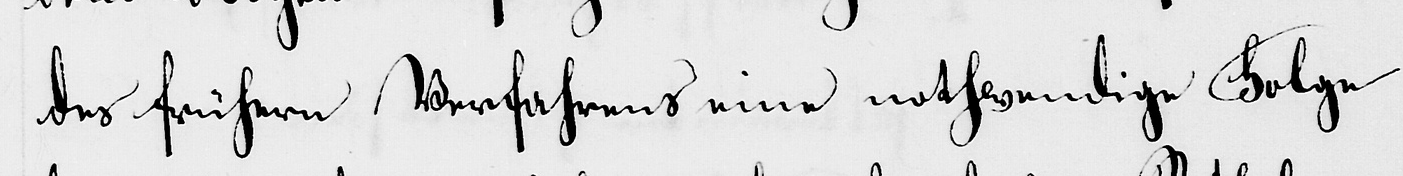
des frühern Verfahrens eine nothwendige Folge
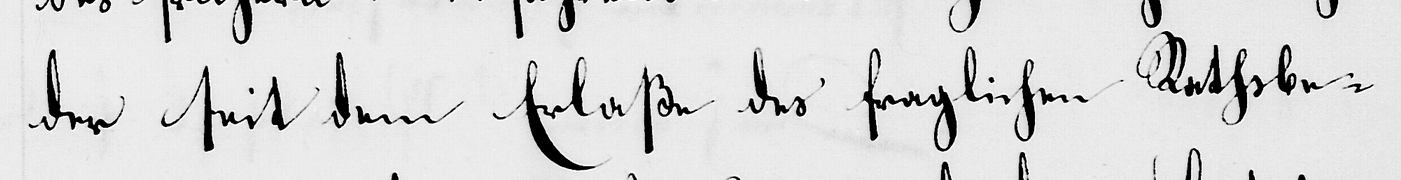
der seit dem Erlaße des fraglichen Ratsbe¬
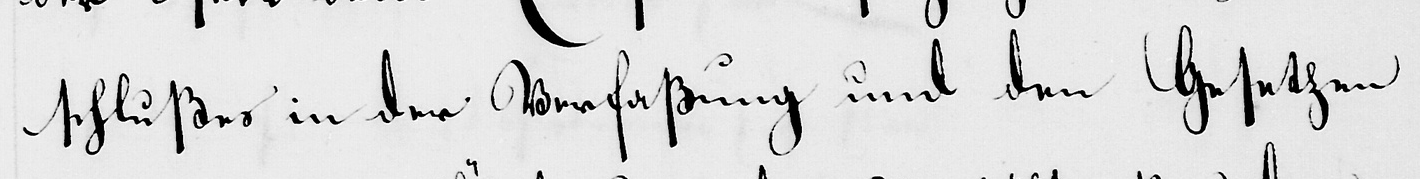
schlußes in der Verfaßung und den Gesetzen
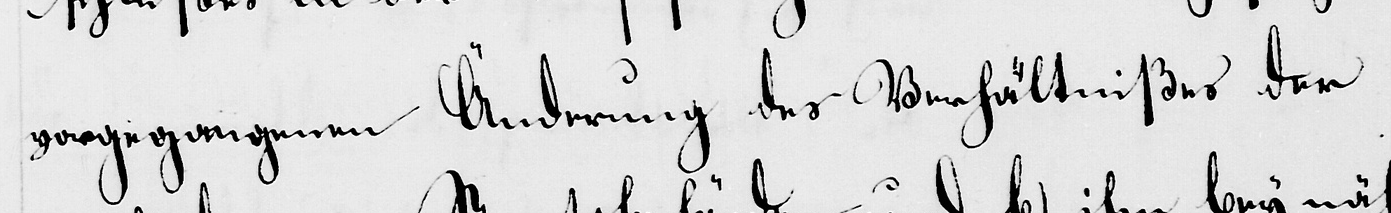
vorgegangenen Änderung des Verhältnißes der
